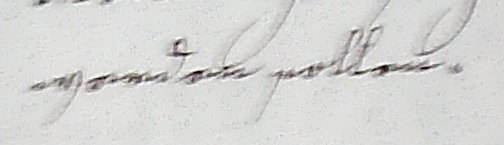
werden sollen.
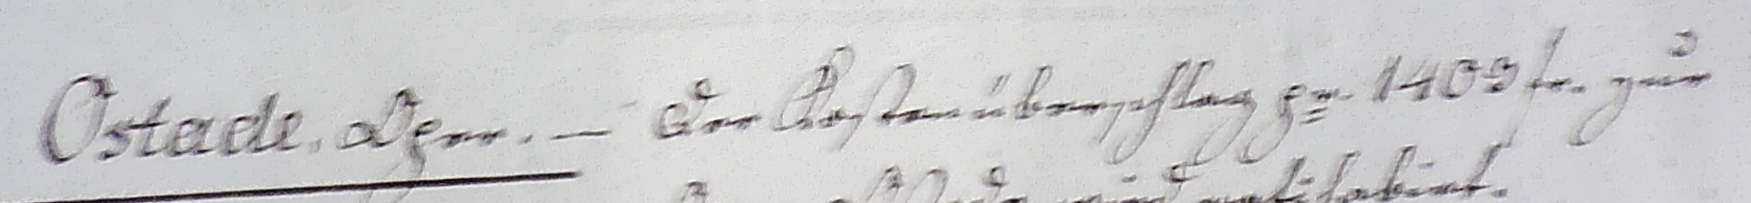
Ostade, Oper .... Der Kostenüberschlag pr͇ 1403fr. zur
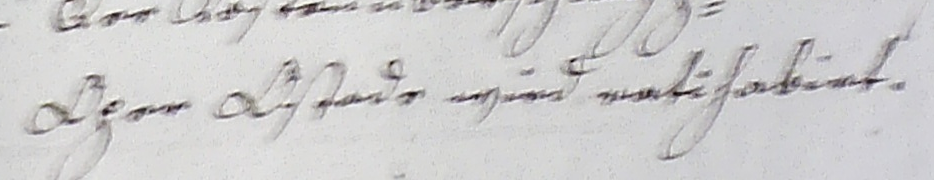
Oper Ostade wird ratihabirt.
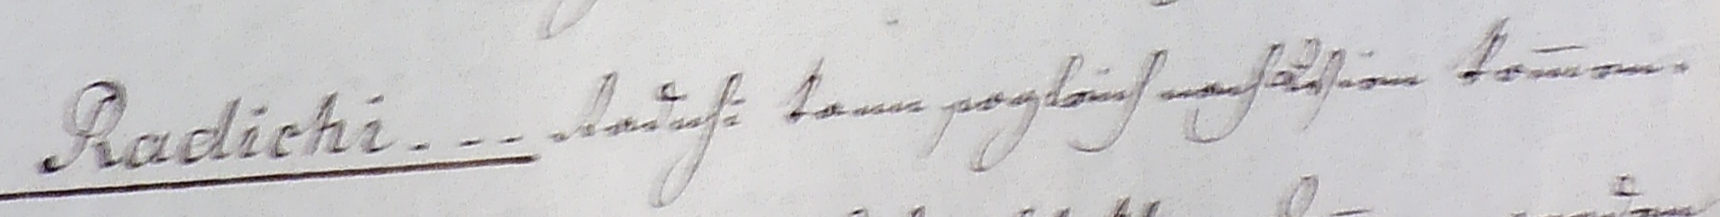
Radichi. .. .. .. Radichi kann sogleich nach Wien kom̅en.
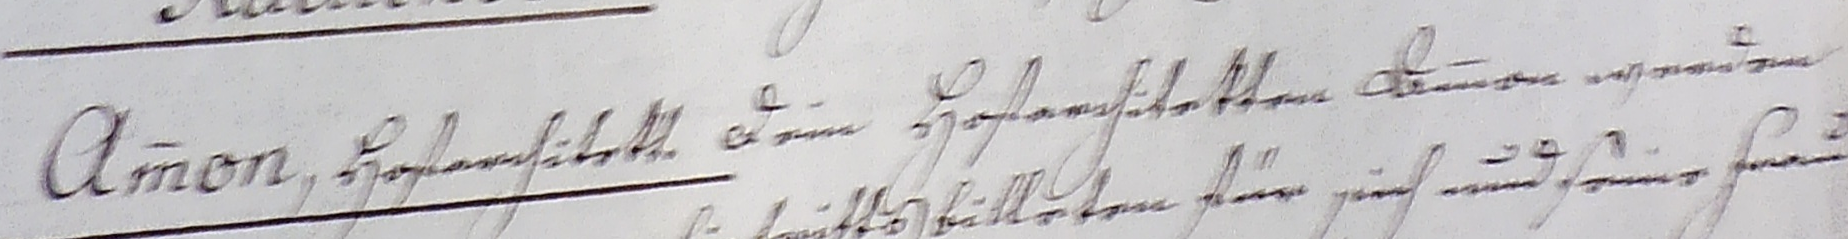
Amon, Hofarchitekt. Dem Hofarchitekten Amon werden
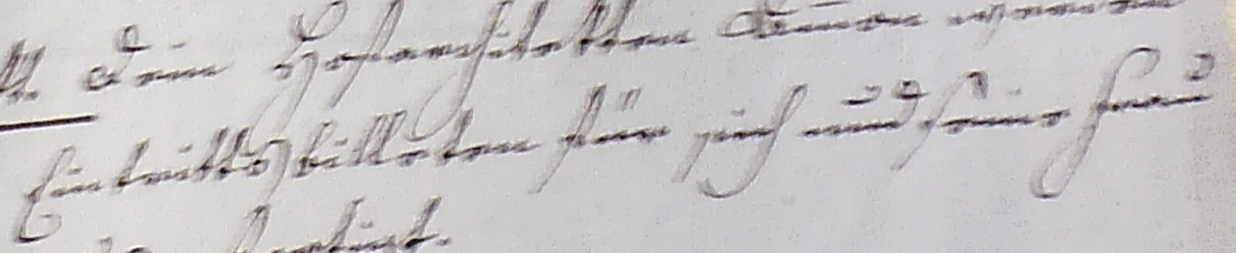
Eintrittsbilleten für sich und seine Frau
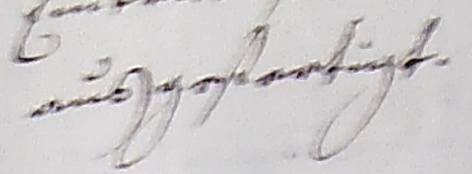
ausgefertigt.
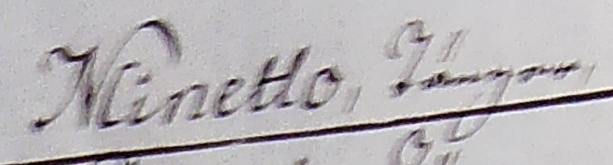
Minetto, Tänzer
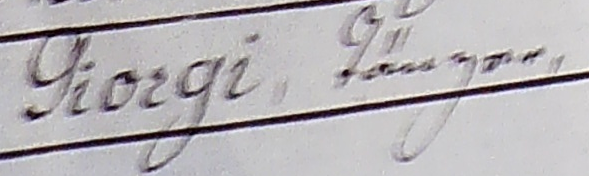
Giorgi, Tänzer
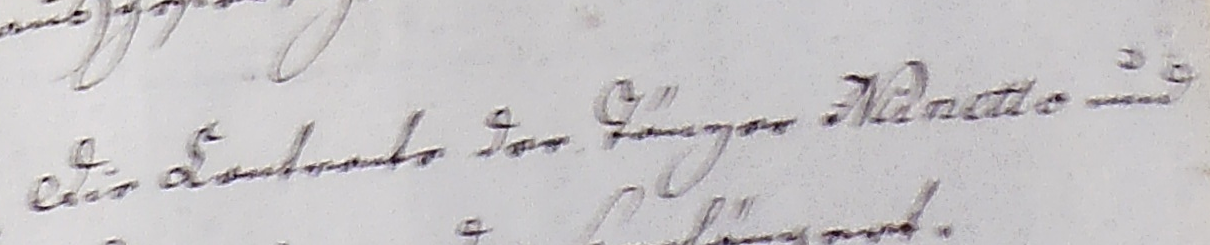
Die Contracte der Tänzer Minetto und
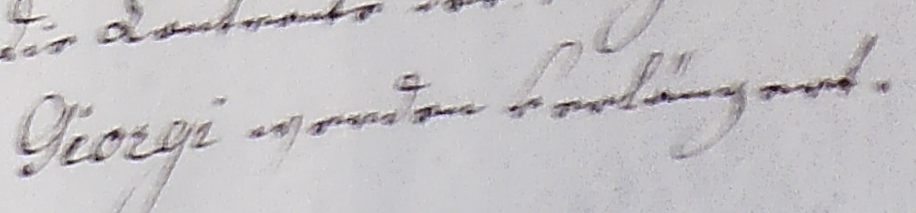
Giorgi werden verlängert.
